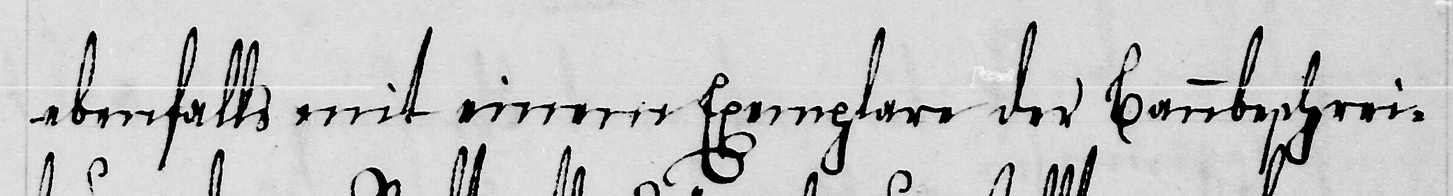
ebenfalls mit einem Exemplare der Bannbeschrei¬
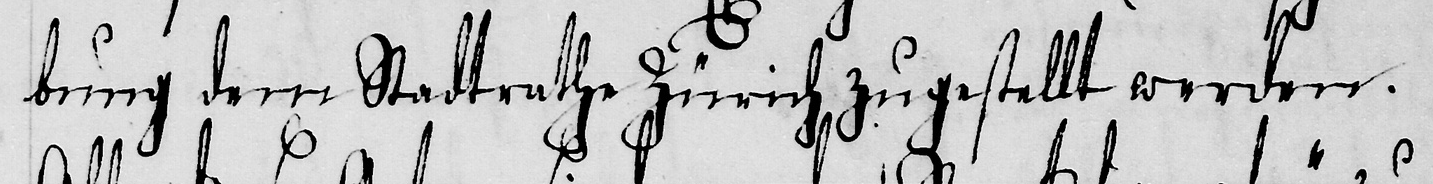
bung dem Stadtrathe Zürich zugestellt werden.
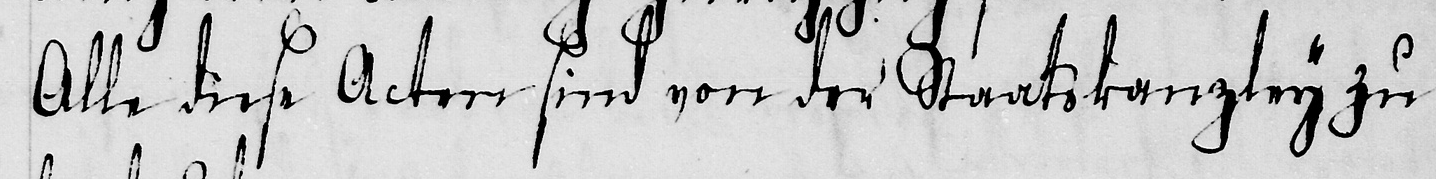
Alle diese Acten sind von der Staatskanzley zu
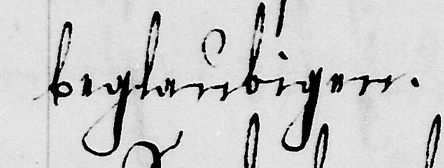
beglaubigen.
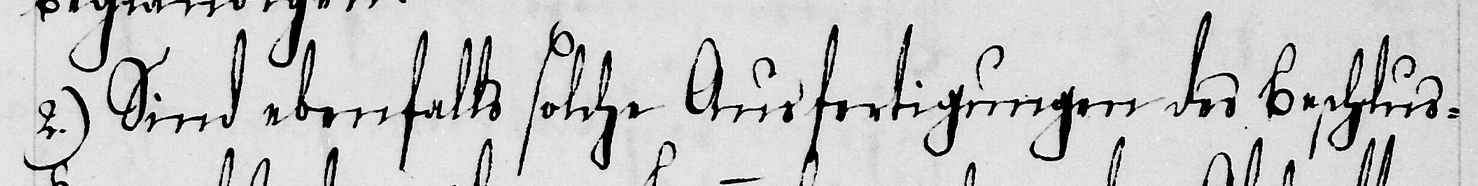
2.) Sind ebenfalls solche Ausfertigungen des Beschluß¬
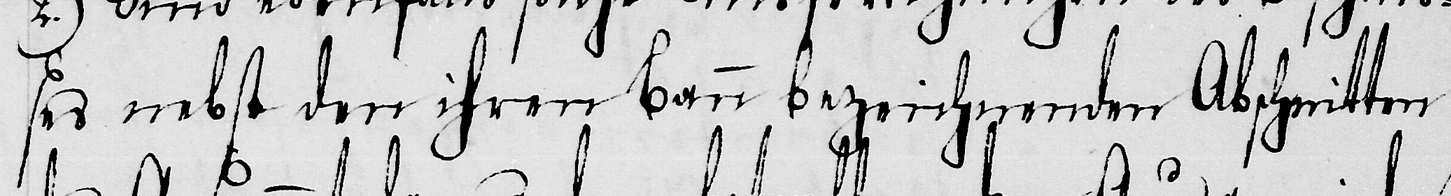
es nebst den ihren Bann bezeichnenden Abschnit¬
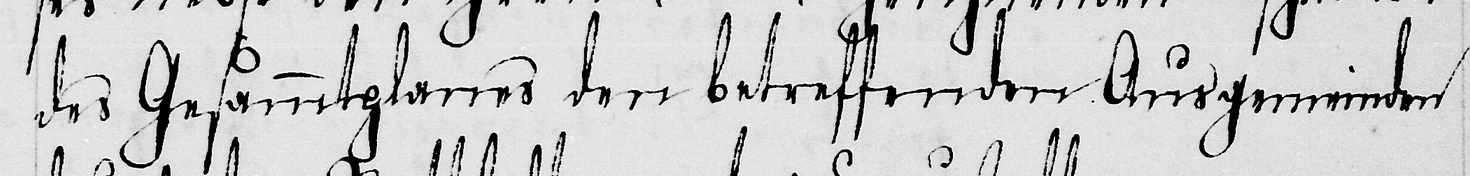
des Gesammtplanes den betreffenden Ausgemeinden
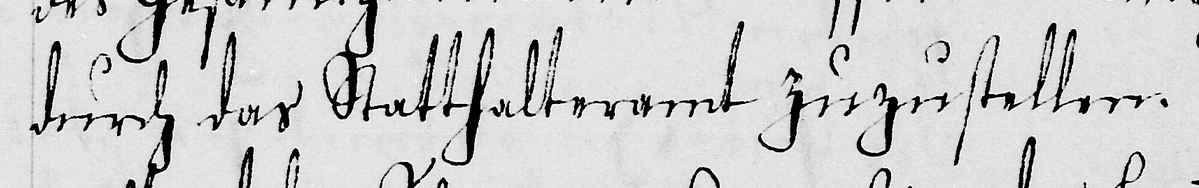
durch das Statthalteramt zuzustellen.
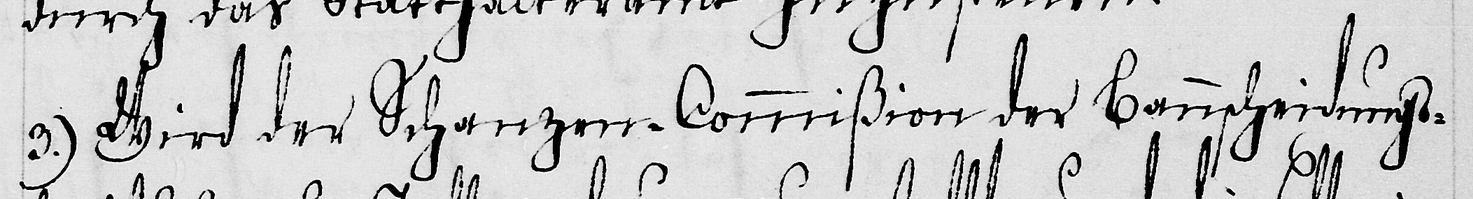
3.) Wird der Schanzen-Commißion der Bannscheidungs¬
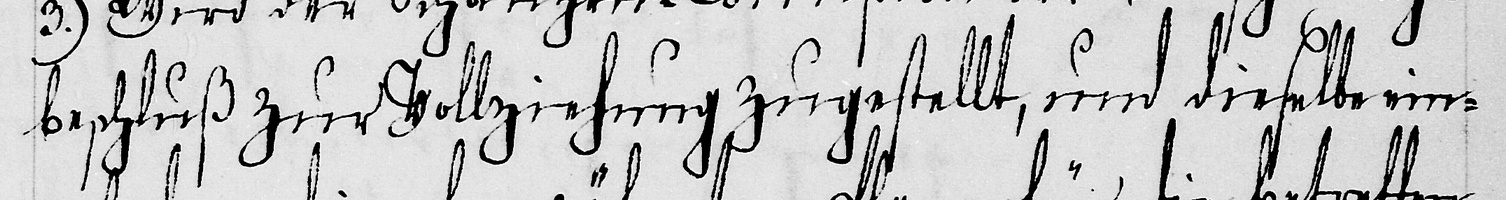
beschluß zur Vollziehung zugestellt, und dieselbe ein¬
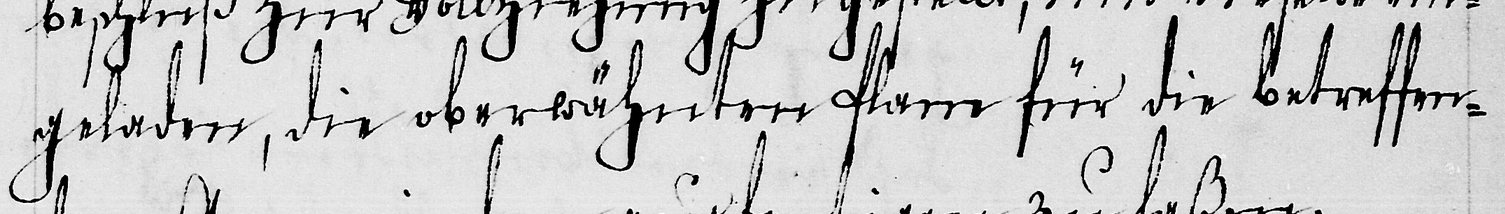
geladen, die oberwähnten Plane für die betreffen¬
